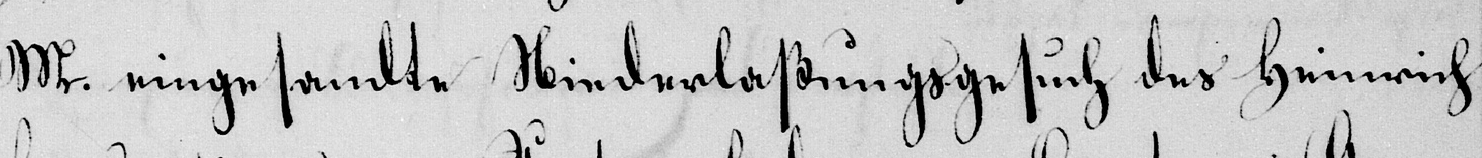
M. eingesandte Niederlaßungsgesuch des Heinrich
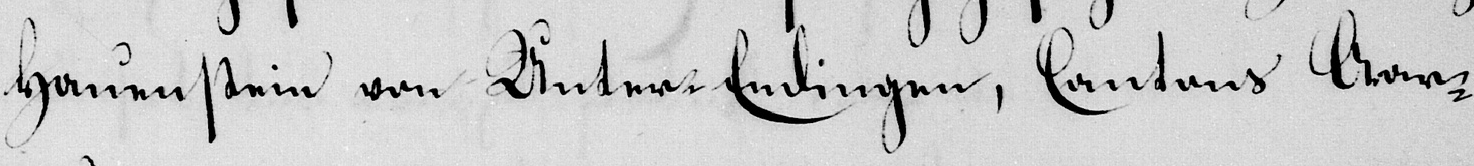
Hauenstein von Unter-Endingen, Cantons Aar¬
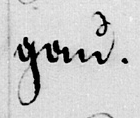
gau.
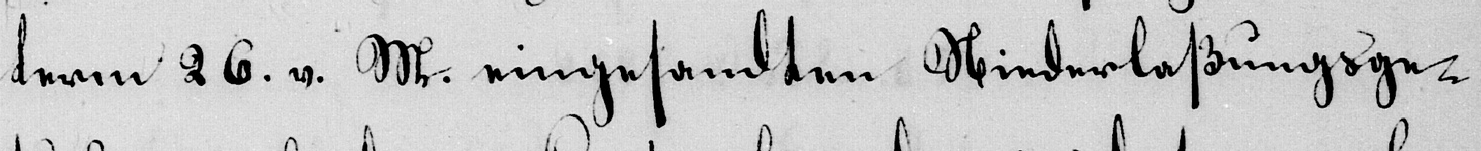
term 26. v. M. eingesandten Niederlaßungsge¬
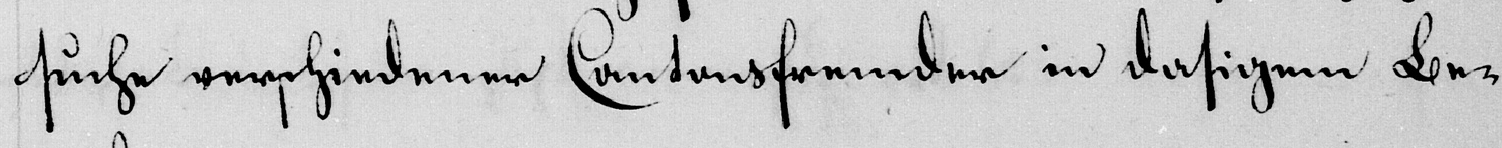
suche verschiedener Cantonsfremder in dasigem Be¬
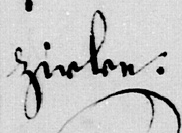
zirke.
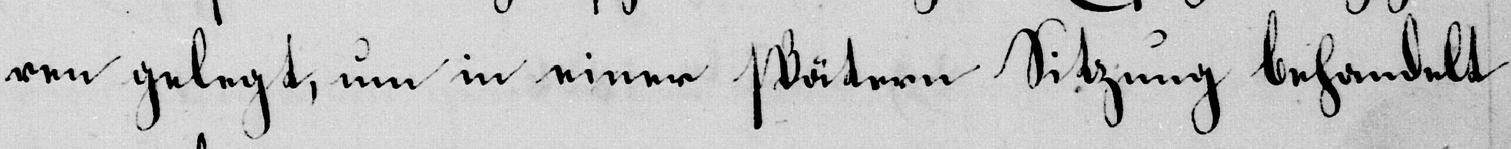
ren gelegt, um in einer späteren Sitzung behandelt
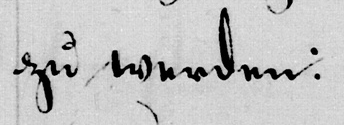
zu werden:
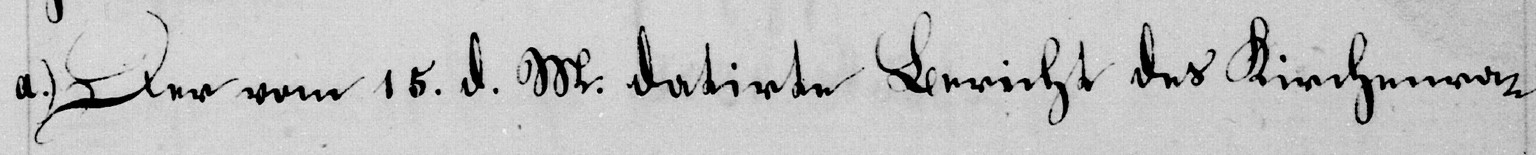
a.) Der vom 15. d. M. datirte Bericht des Kirchenra-
